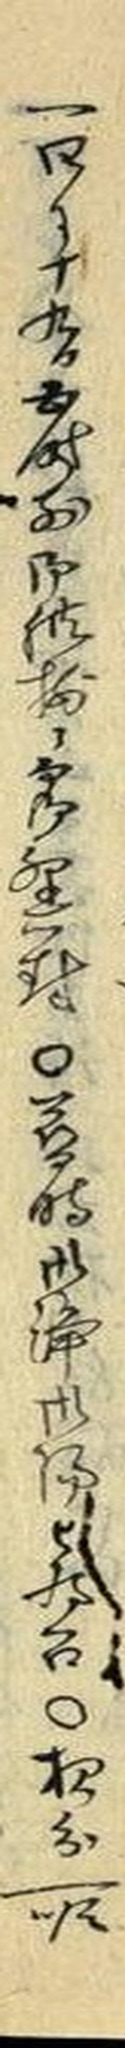一四月十九日五時前御供揃ニ而御逢対○暮時御浄御湯被為召○夜分一順
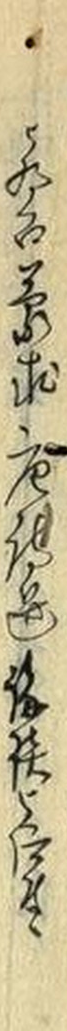被為召蒙唐詩選講談被仰付候
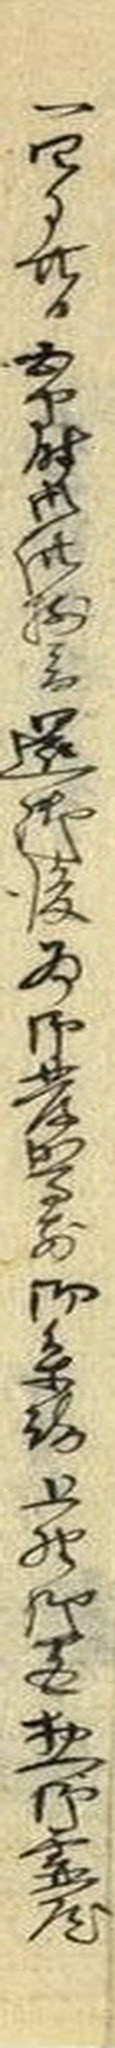一四月廿日五半時御供揃ニ而還御後為御発駕前御参詣上野御宮惣御霊屋
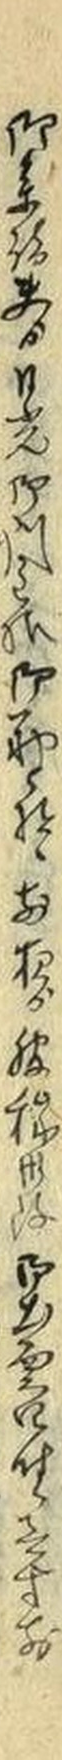御参詣夫ゟ日光御門主様御勤被遊候前夜ゟ服穢御改御出殿四時へ壱寸前
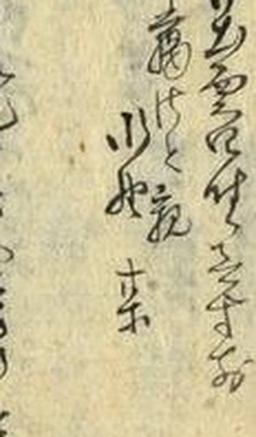水野某
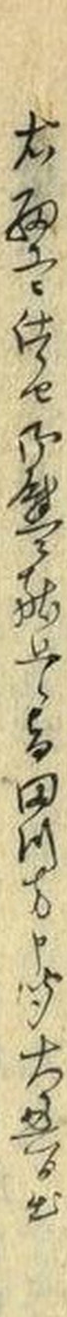右細工ニ仕候由御慰ニ献上候旨田川方申聞大奥ゟ出
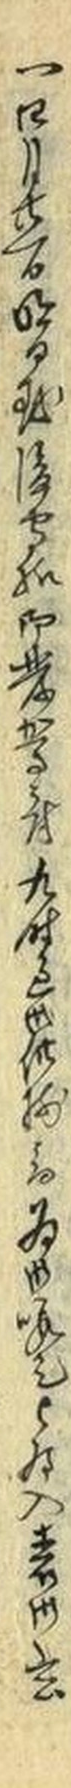一四月廿一日明日越後守様御発駕ニ付九時過御供揃ニ而為御暇乞被為入表御玄
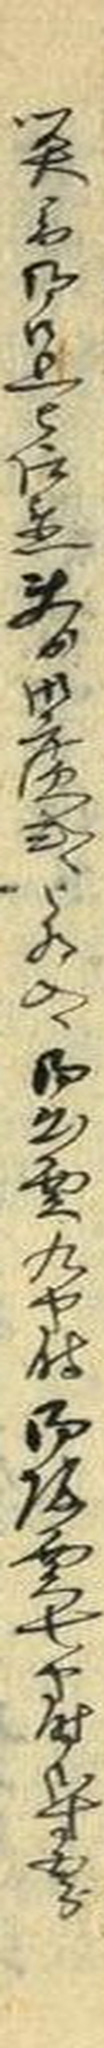関ニ而御口上被仰置夫ゟ御広式へ被為入候御出殿九半時御帰殿七半時弐寸五分
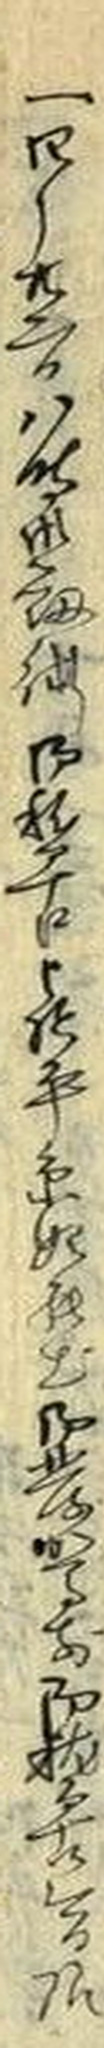一四月廿二日八時御釼術御稽古被遊平兵衛始罷出御発駕前御稽今日限
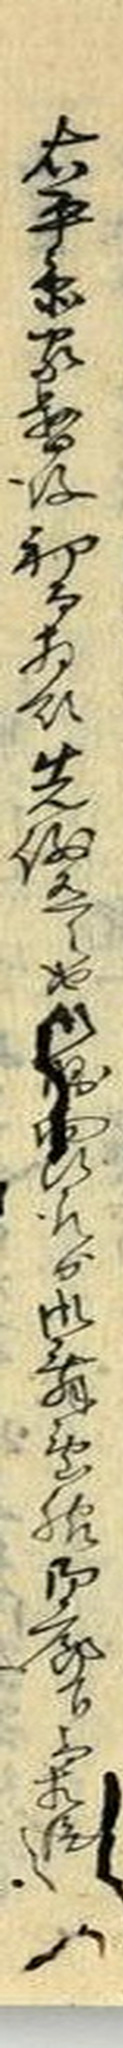右平兵衛家督後初而拝領先例有之由御側向頭取ゟ御舞台脇御廊下ニ而相渡之
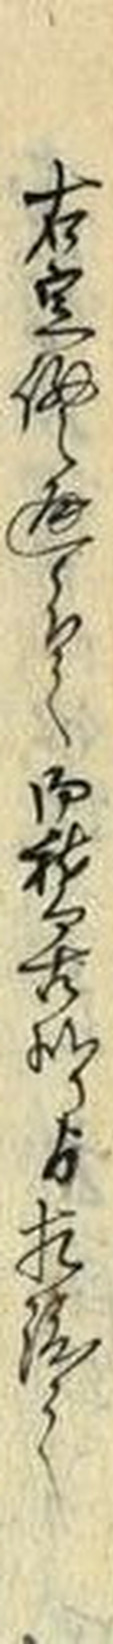右定例之通被下之御稽古掛りゟ相渡之
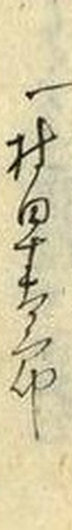村田十太郎
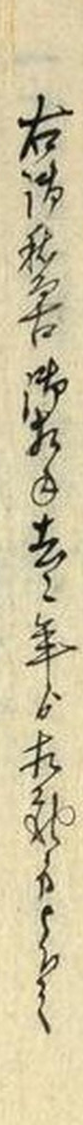右御稽古御相手去々年ゟ相勤候ニ付被下之
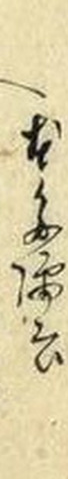本多弥六
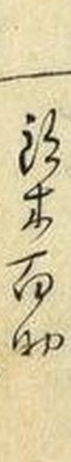鈴木百助
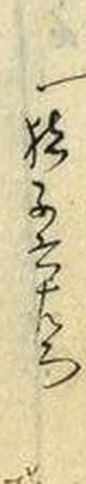猪子六左衛門
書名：少傅日録抄（斉承付側向頭取日記、在府）
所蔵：福井県文書館 Fukui Prefectural Archives
